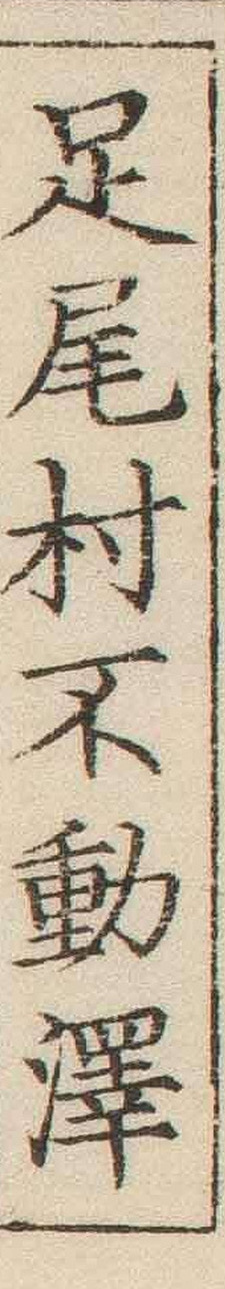足尾村不動澤

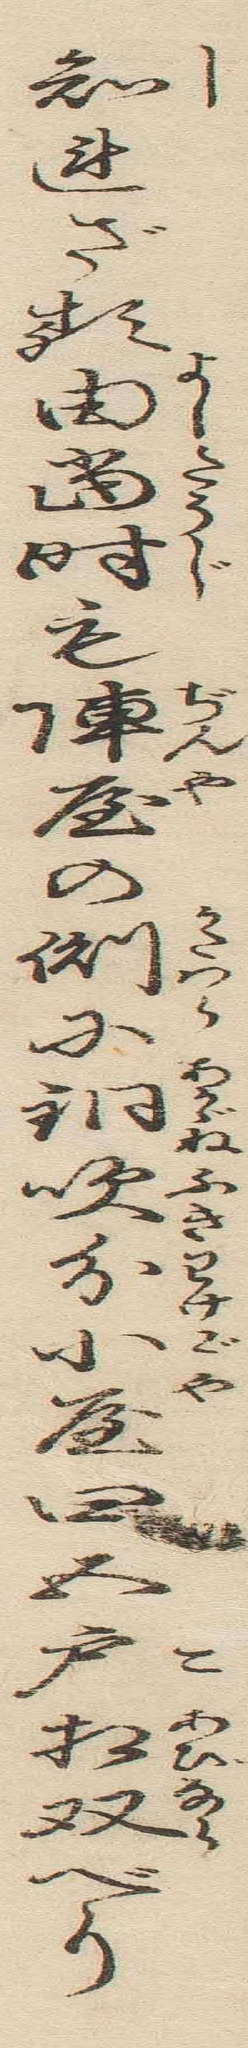知れざる由當时も陣屋の側に銅吹分小屋四五戸相双べり
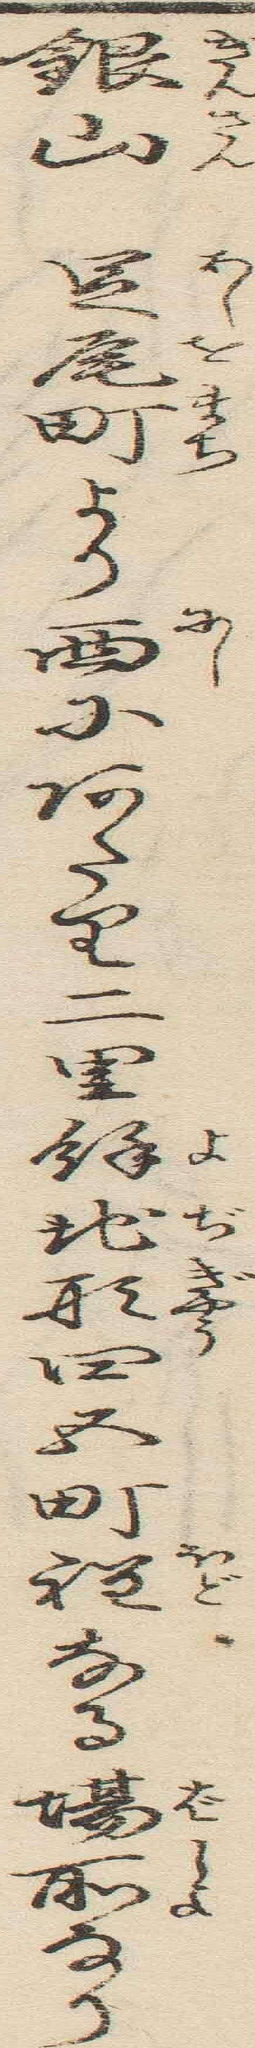銀山足尾町より西にあたり二里餘地形四五町程なる塲所なり
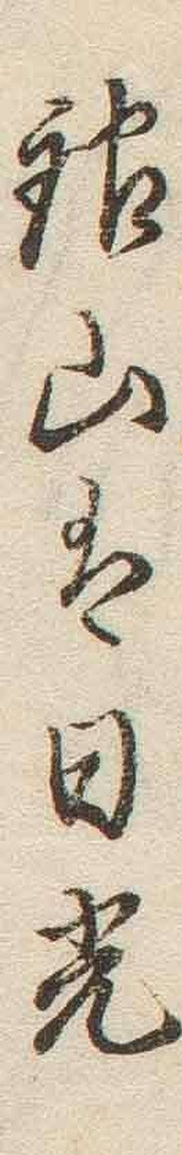銀山は日光
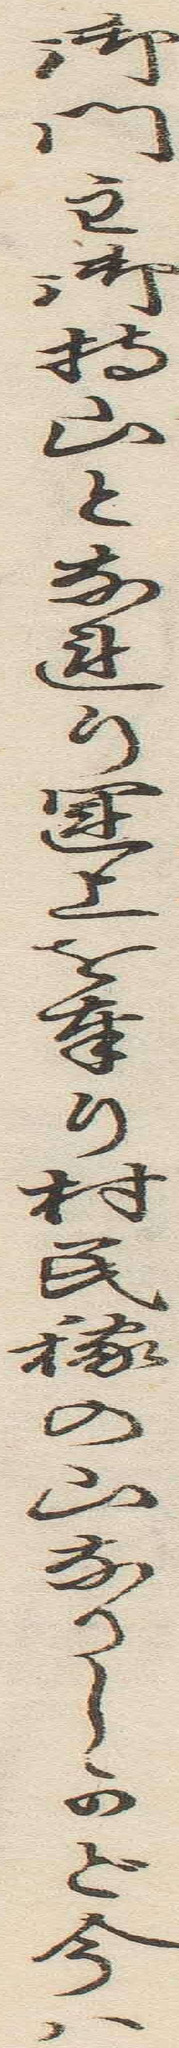御門主御持山となれり運上を奉り村民稼の山なりしかど今は
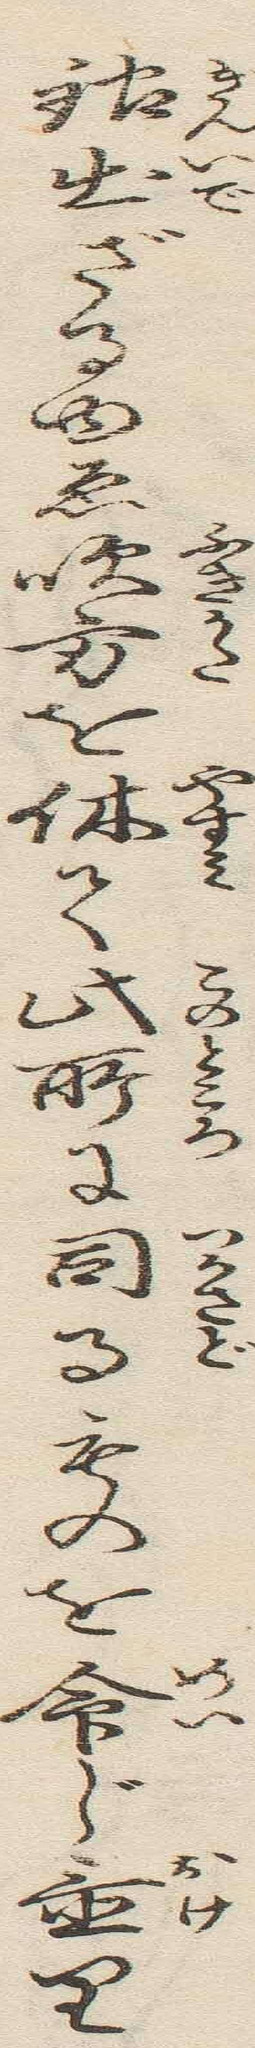銀出ざるゆゑ吹方を休て此所に司るものを命じ置り
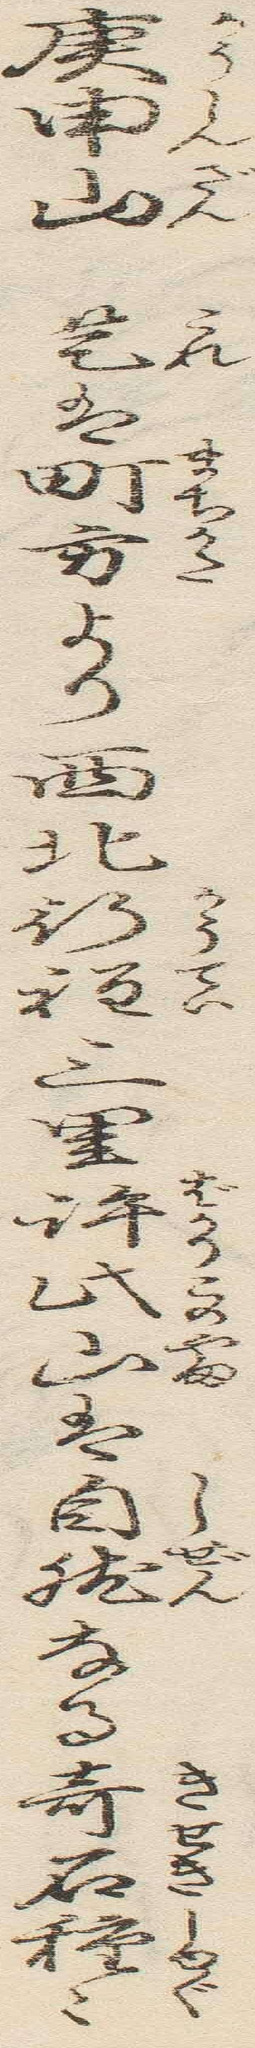庚申山是は町方より西北行程三里許此山は自然なる竒石種〻
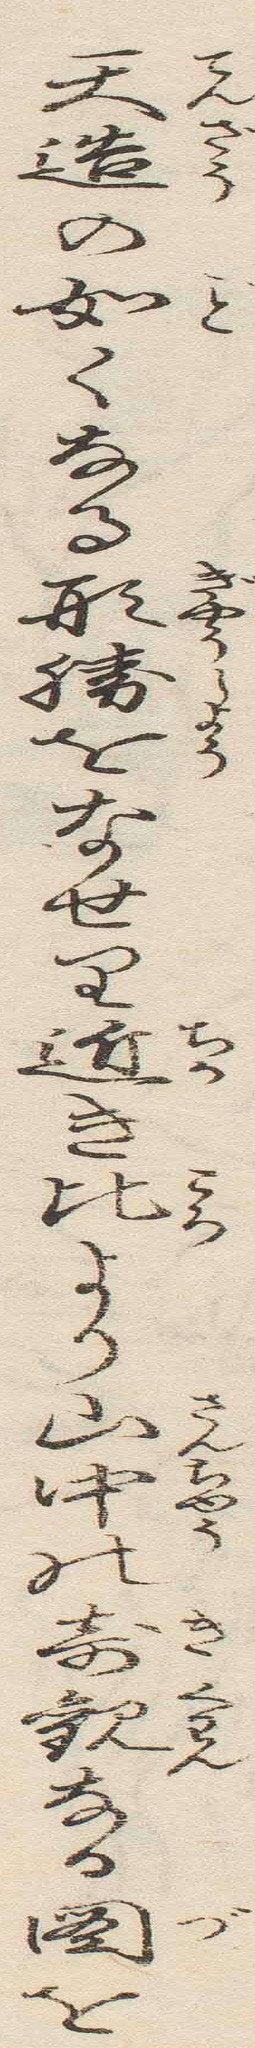天造の如くなる形勝をなせり近き比より山中の竒觀なる圖を
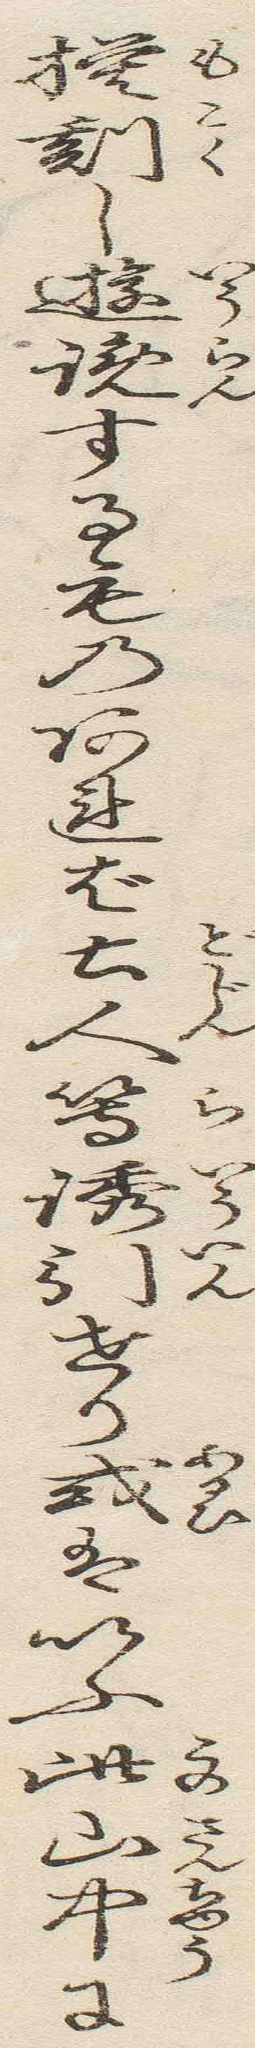摸刻し逰覧するものあれば土人等誘引せり或はいふ此山中に
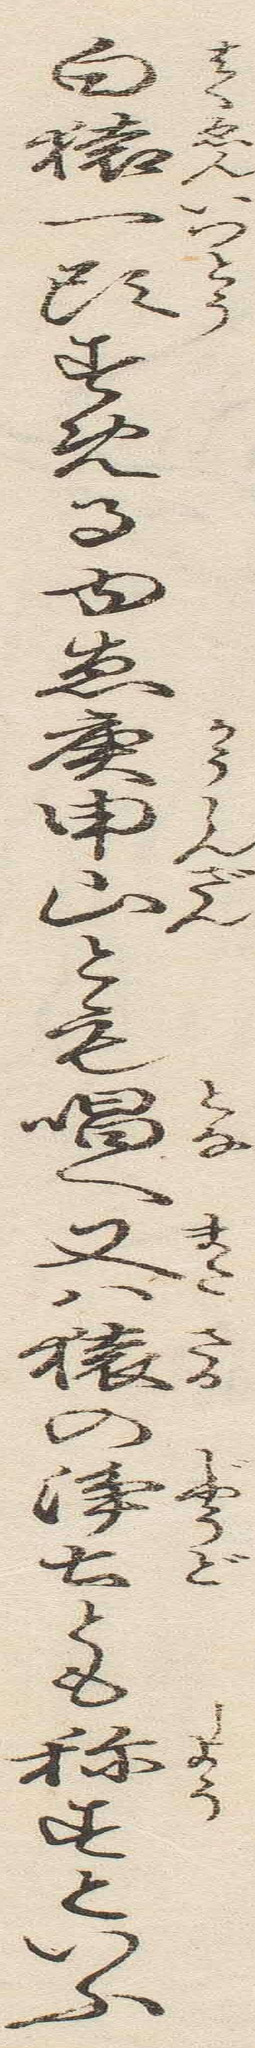白猿一頭すめるゆゑ庚申山とも唱へ又は猿の浄土とも称すといふ
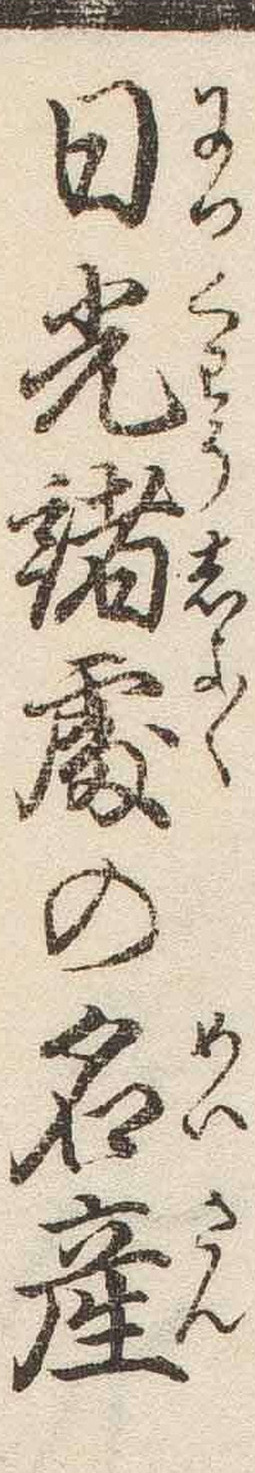日光諸處の名産

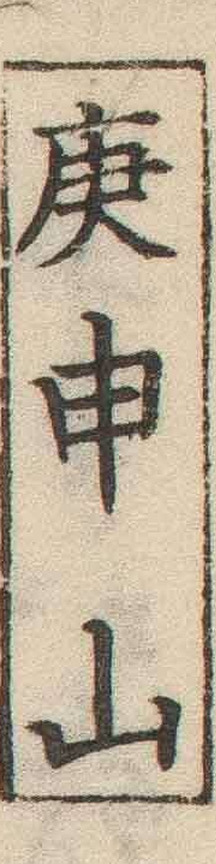庚申山
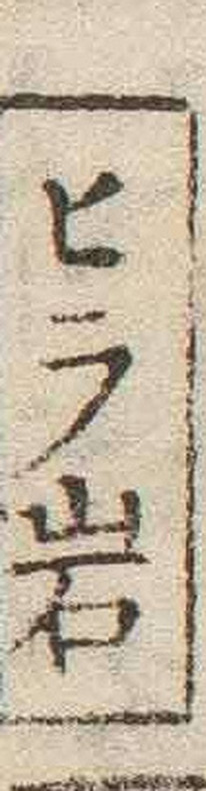ヒラ岩
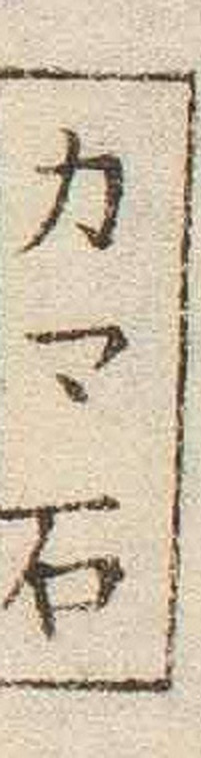カマ石
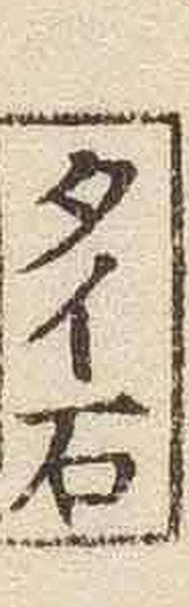タイ石
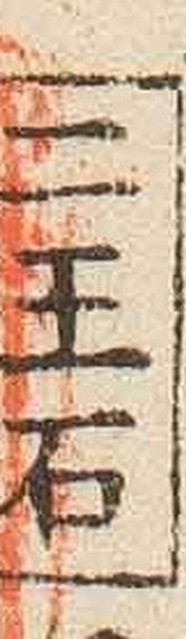二王石
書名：日光山志
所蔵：東京学芸大学附属図書館 国文学研究資料館
